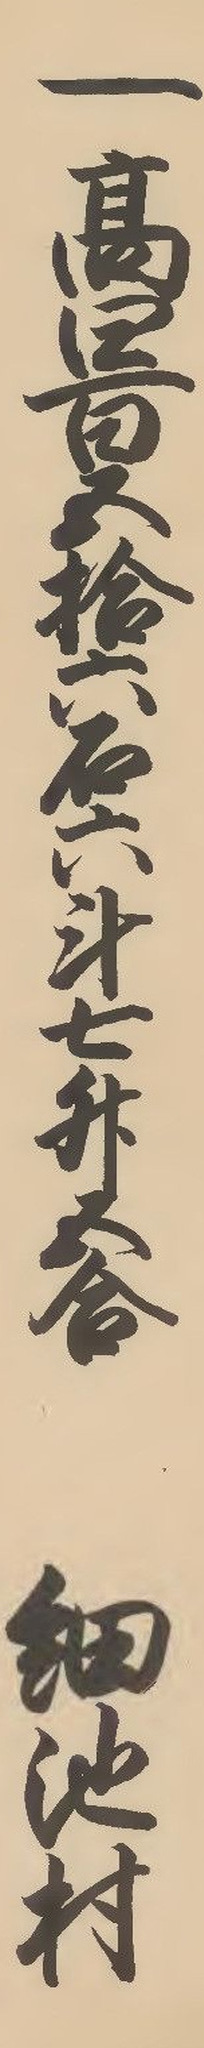一高四百五拾六石六斗七升五合細池村
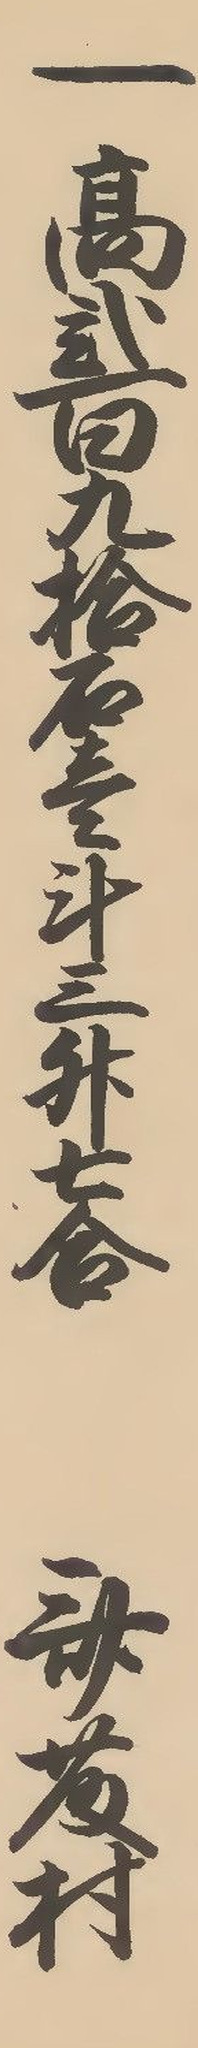一高弐百九拾石壱斗三升七合斎藤村
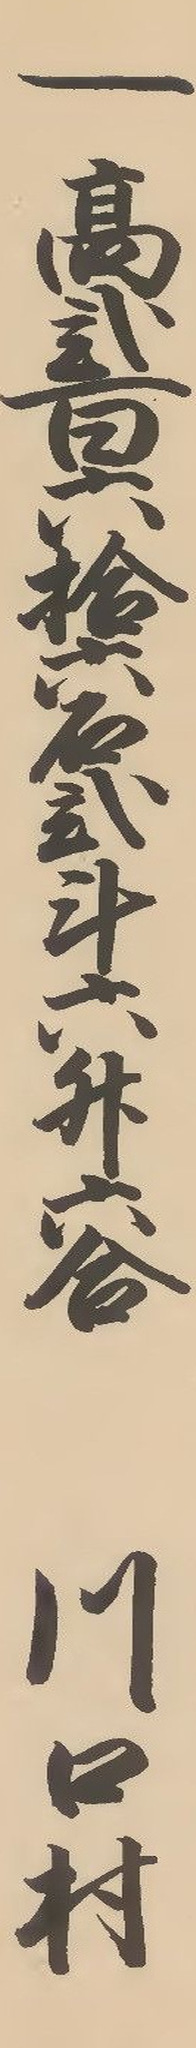一高弐百六拾六石弐斗六升六合川口村
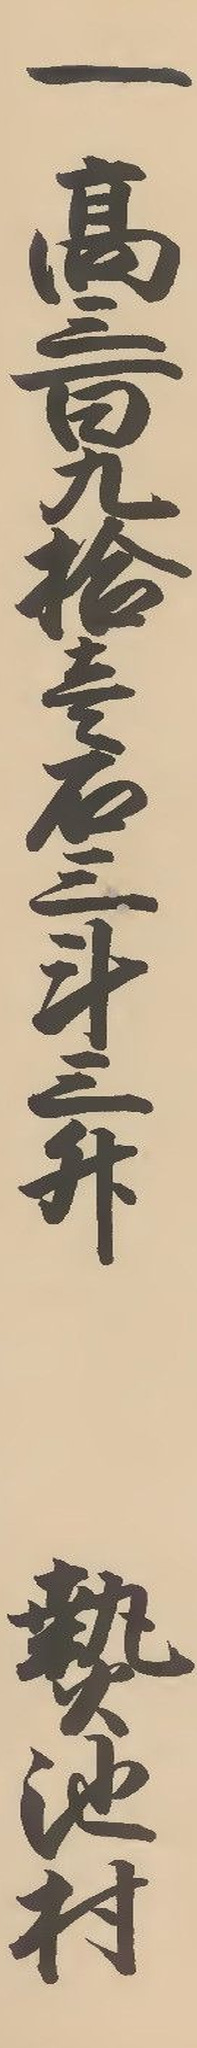一高三百九拾壱石三斗三升熱池村
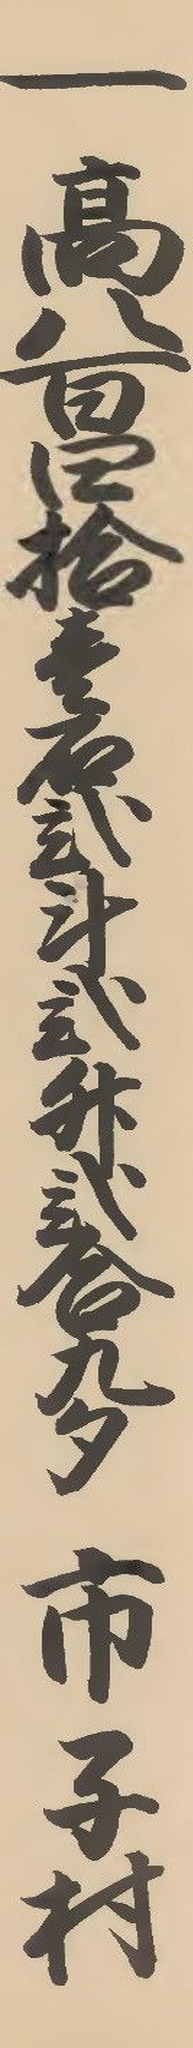一高八百四拾壱石弐斗弐升弐合九勺市子村
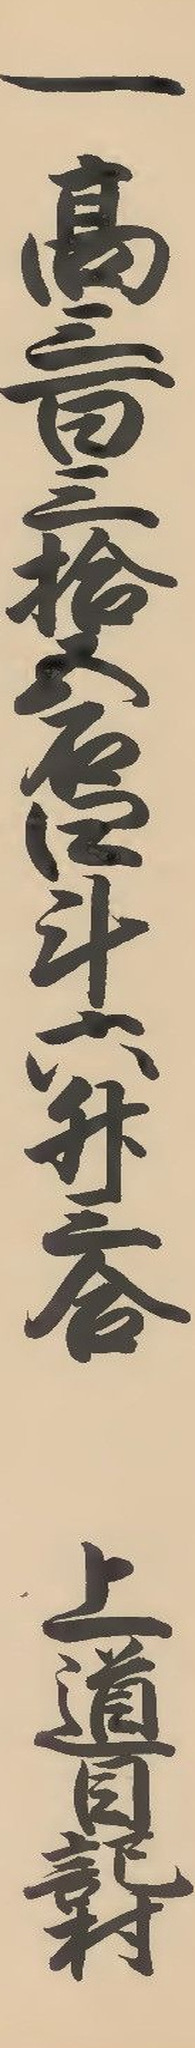一高三百三拾五石四斗六升三合上道目記村
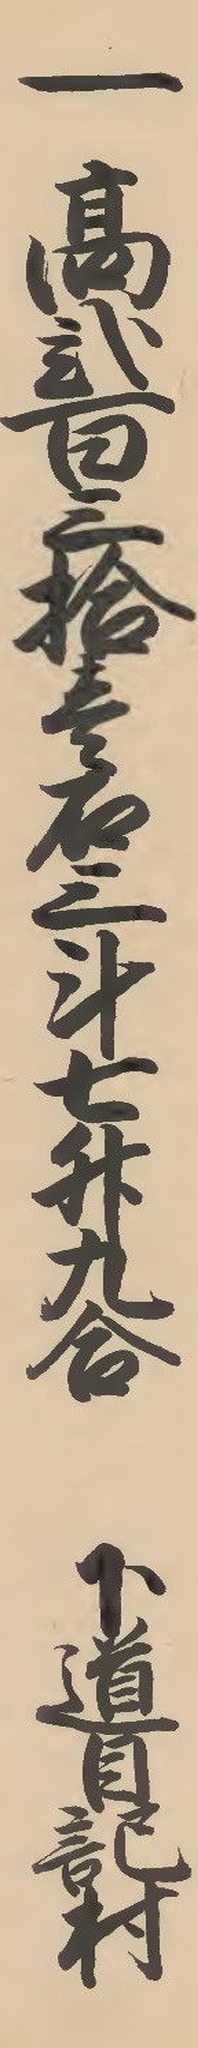一高弐百三拾壱石三斗七升九合下道目記村
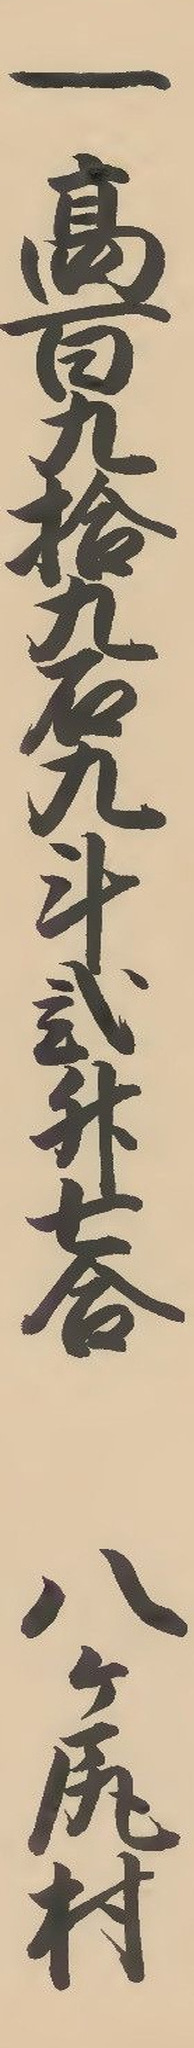一高百九拾九石九斗弐升七合八ヶ尻村

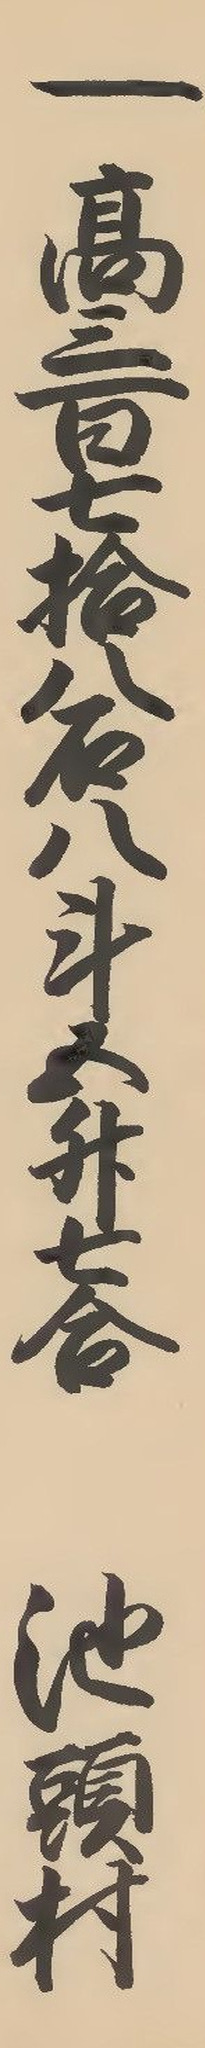一高三百七拾八石八斗五升七合池頭村
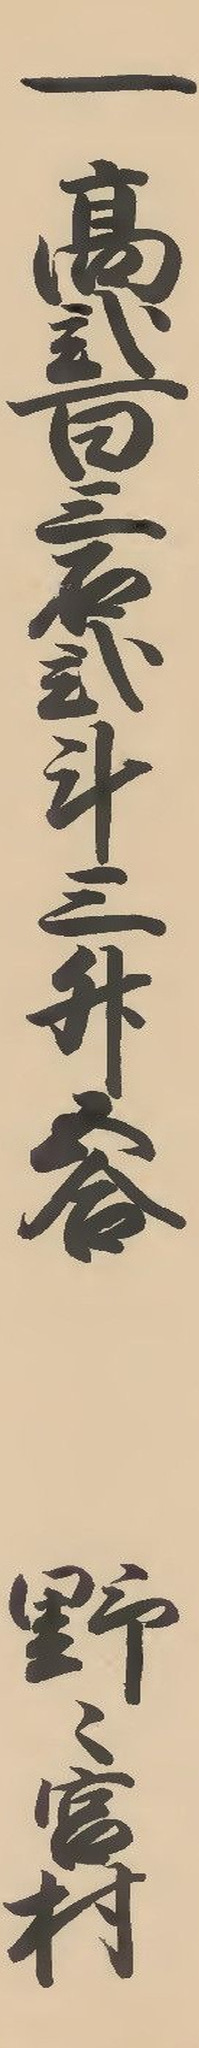一高弐百三石弐斗三升五合野々宮村
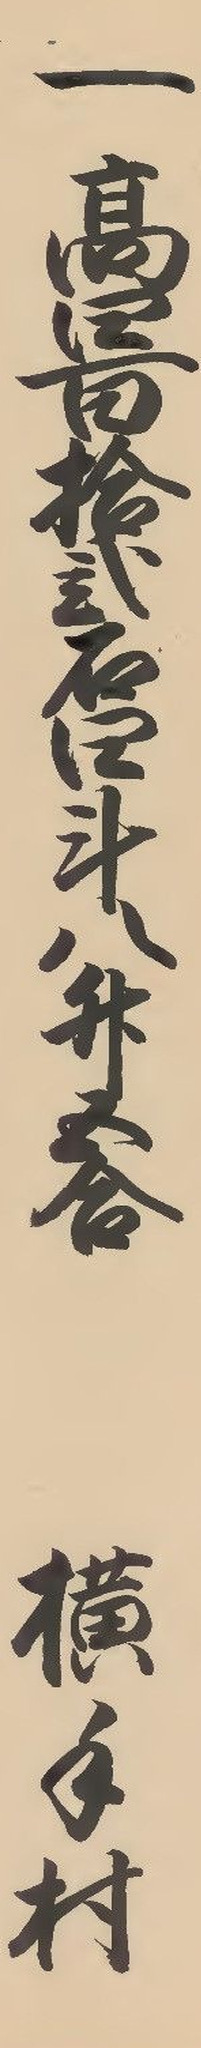一高四百拾弐石四斗八升五合横手村
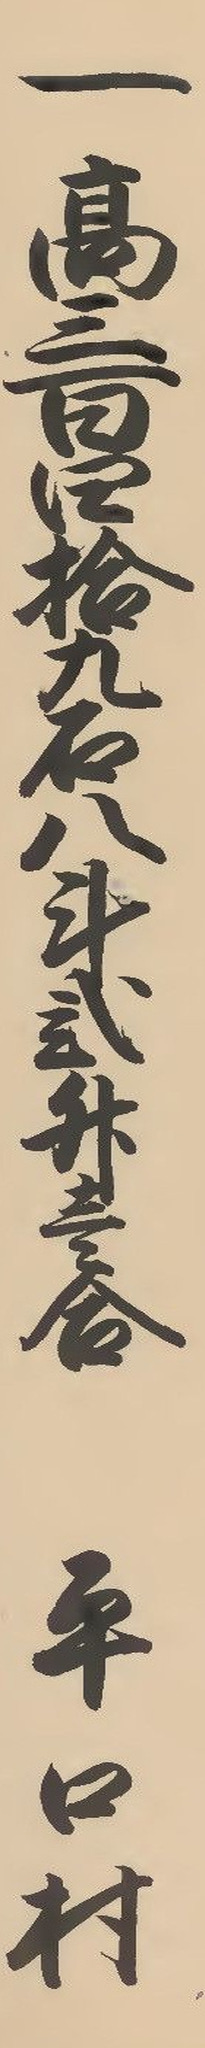一高三百四拾九石八斗弐升壱合平口村
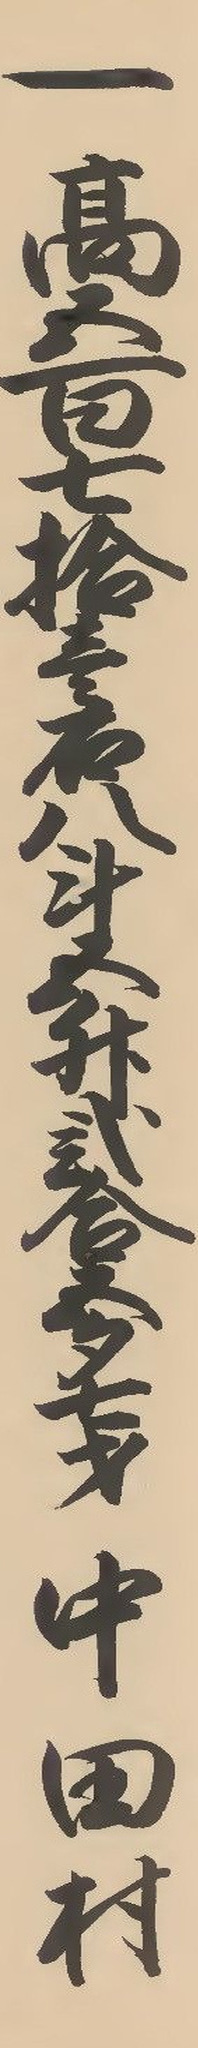一高五百七拾壱石八斗五升弐合五勺七才中田村
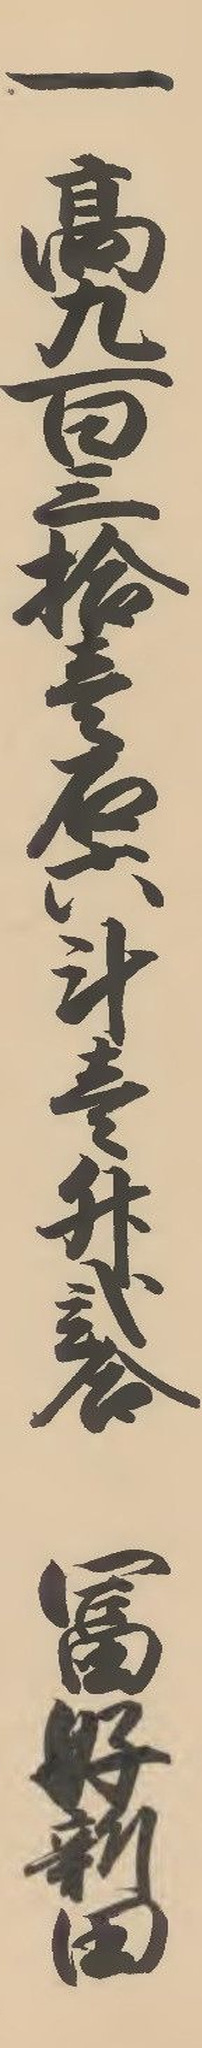一高九百三拾壱石六斗壱升弐合富好新田
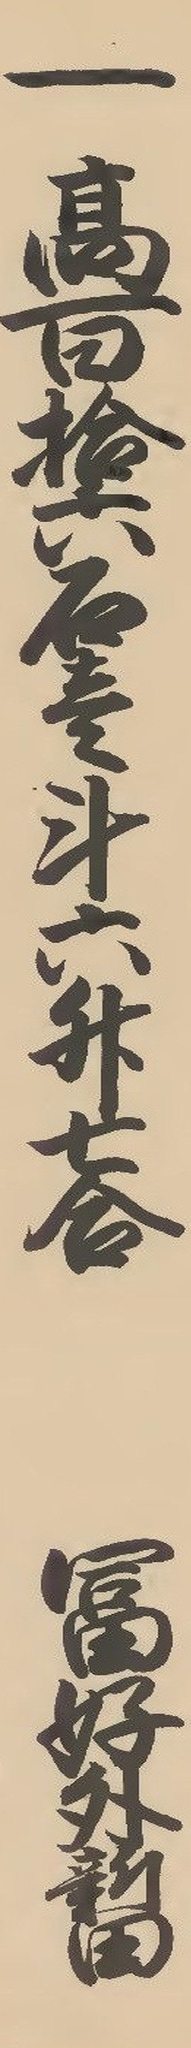一高百拾六石壱斗六升七合富好外新田
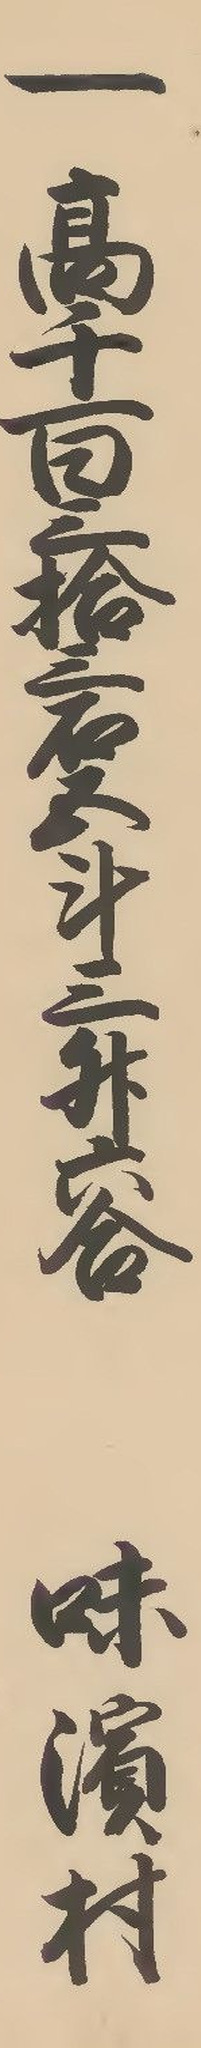一高千百三拾三石五斗三升六合味浜村
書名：三河国郷帳
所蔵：国立公文書館 National Archives of Japan
